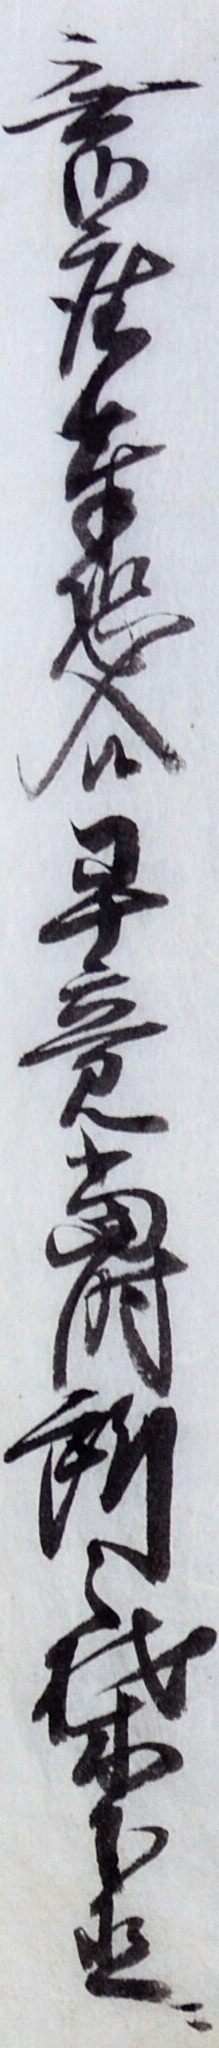無御座奉恐入候畢竟当時所々材木下直ニ

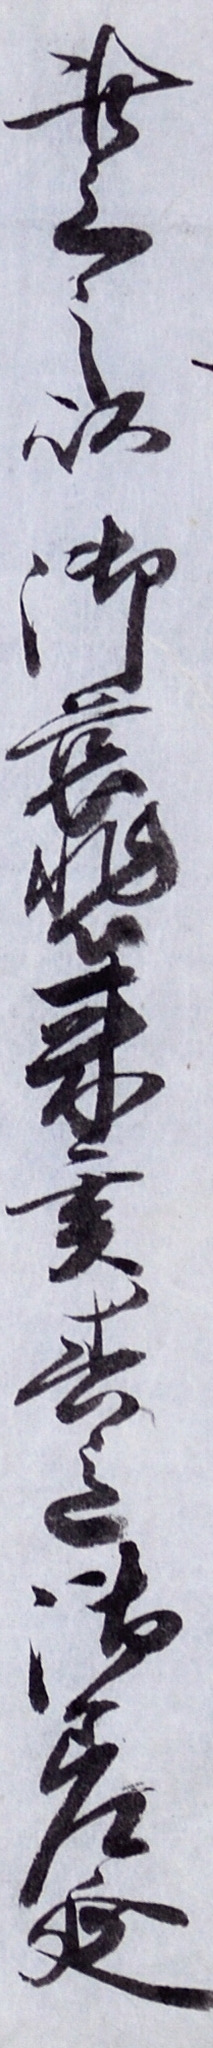此上之以御慈悲来亥春迄御差延
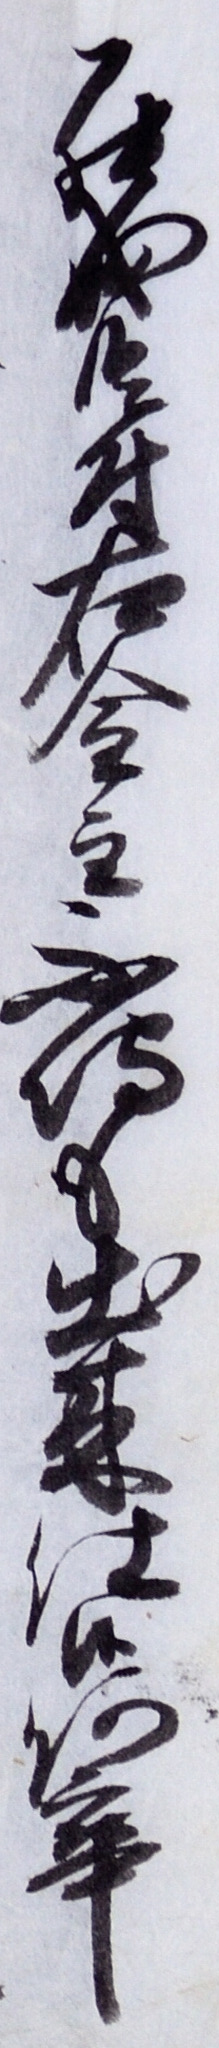罷成候ニ付右金主不埒も出来仕候何卒
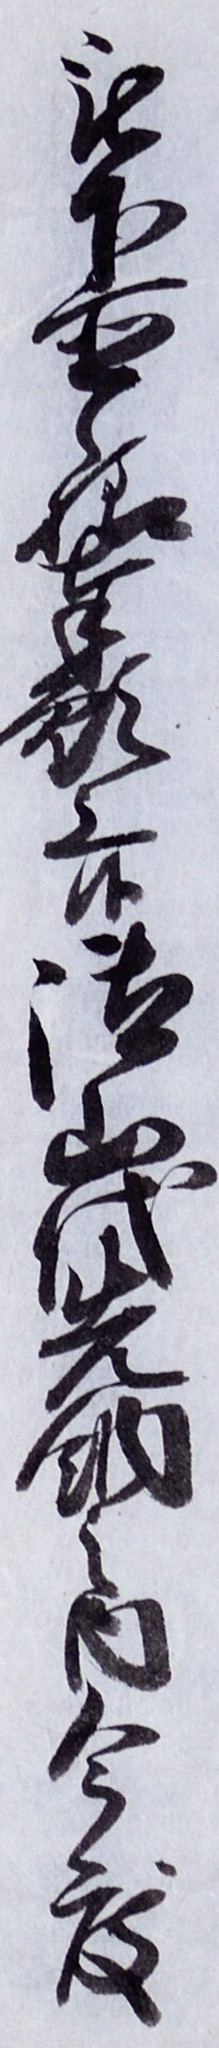被下置候様奉願上候御山代先納之内今度
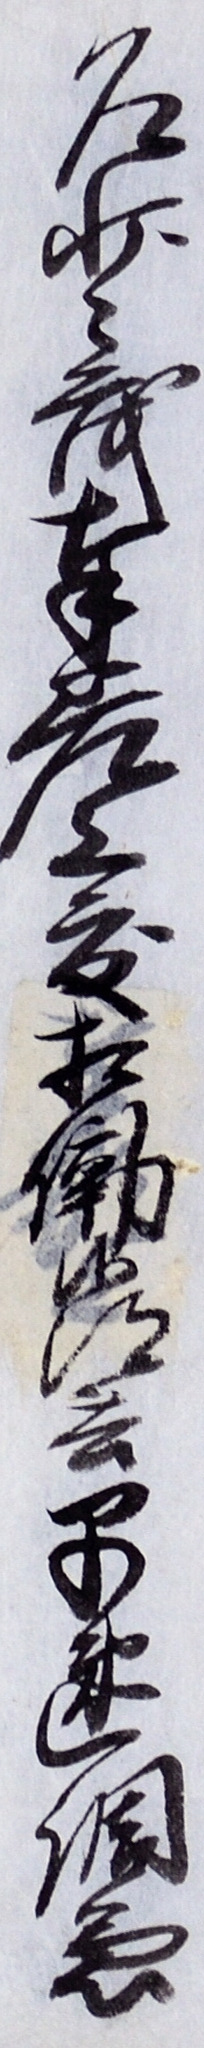乍少々も奉差上度相働候得共早速調急
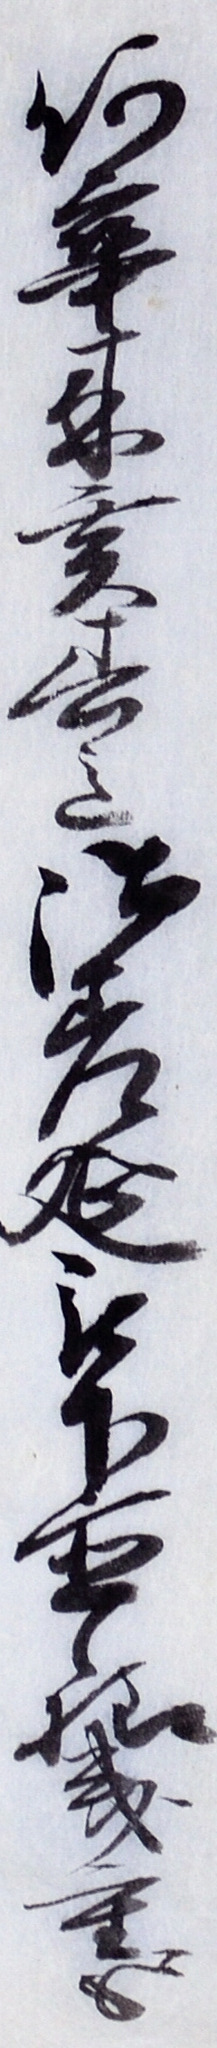何卒来亥春迄御差延被下置候様幾重ニも
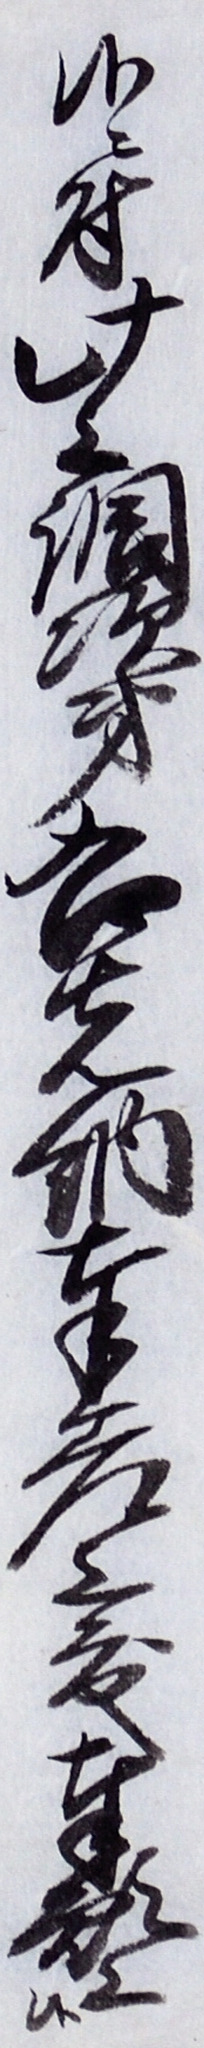候ニ付此上調次第右先納奉差上度奉願上候
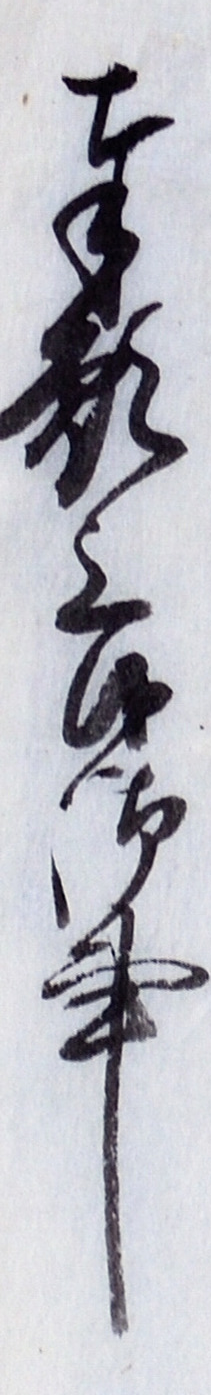奉願上候御事
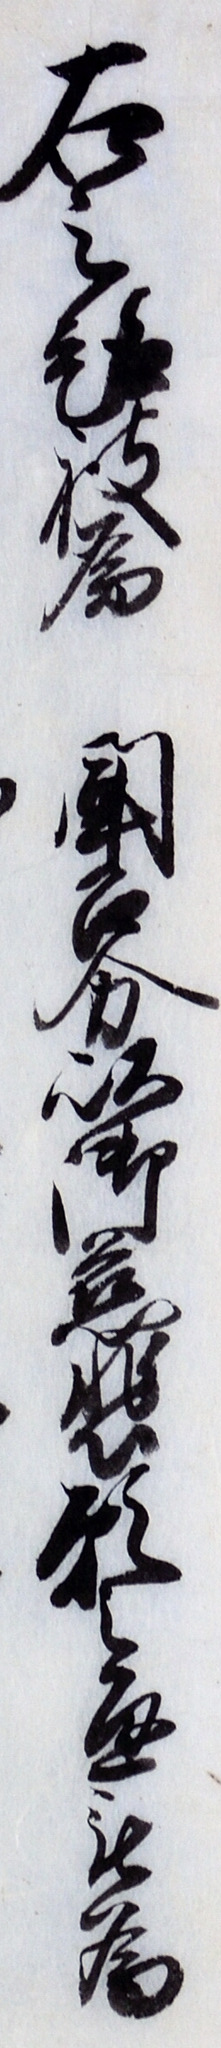右之趣被為聞召分以御慈悲願之通被為
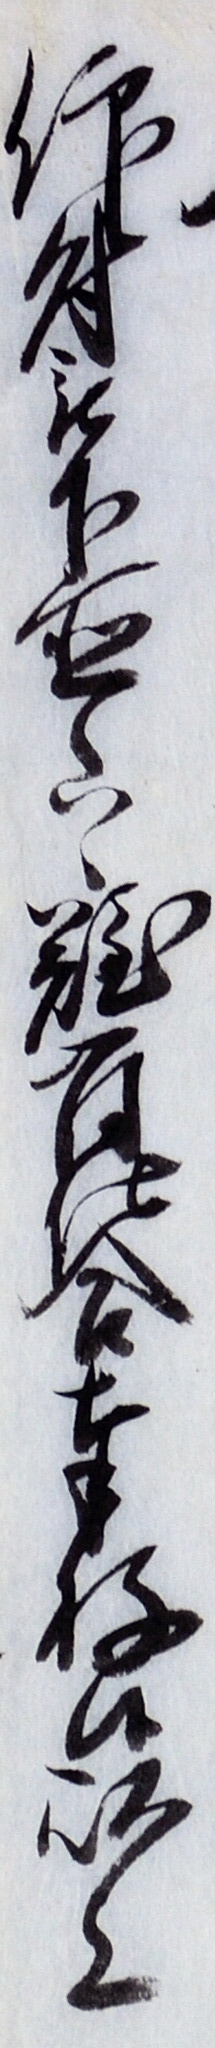仰付被下置候ハヽ難有仕合奉存候以上
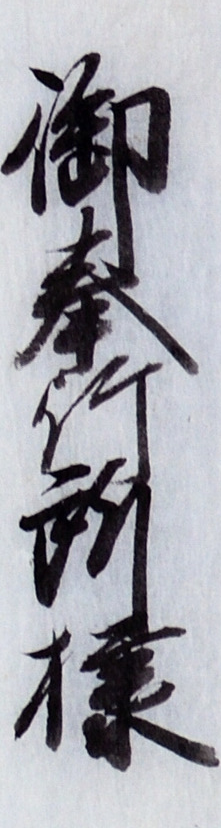御奉行所様

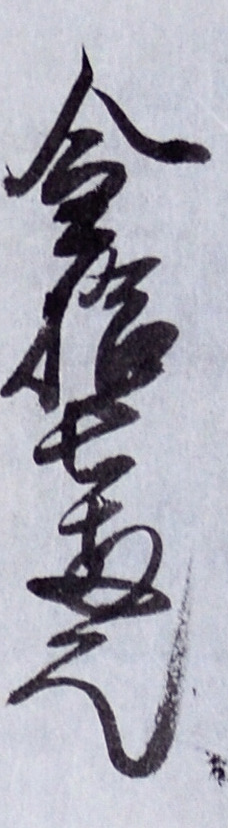金拾七両也
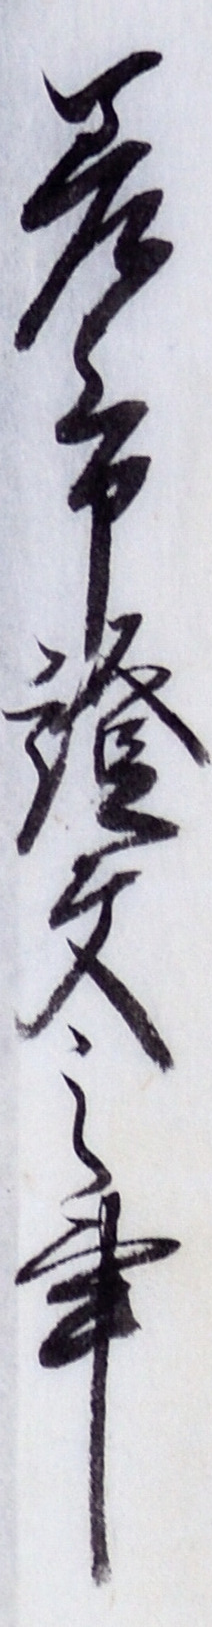差上申証文之事
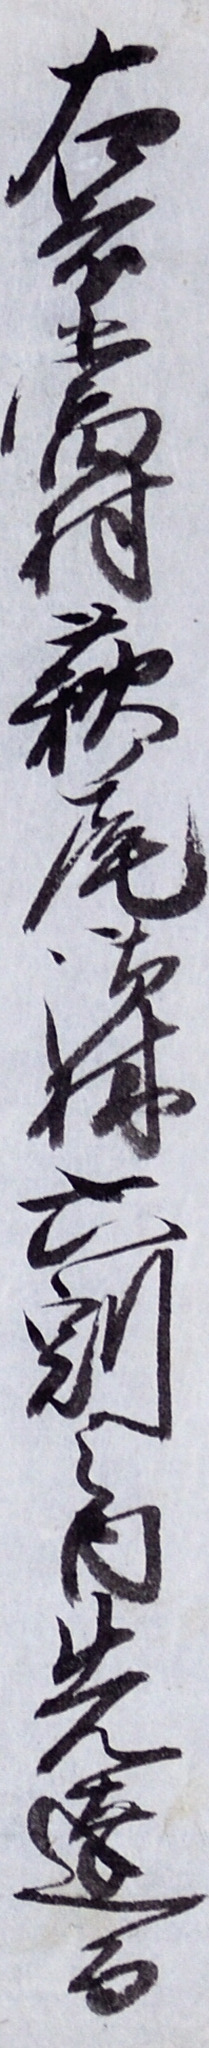右者当村萩ノ尾御林六割之内先達而
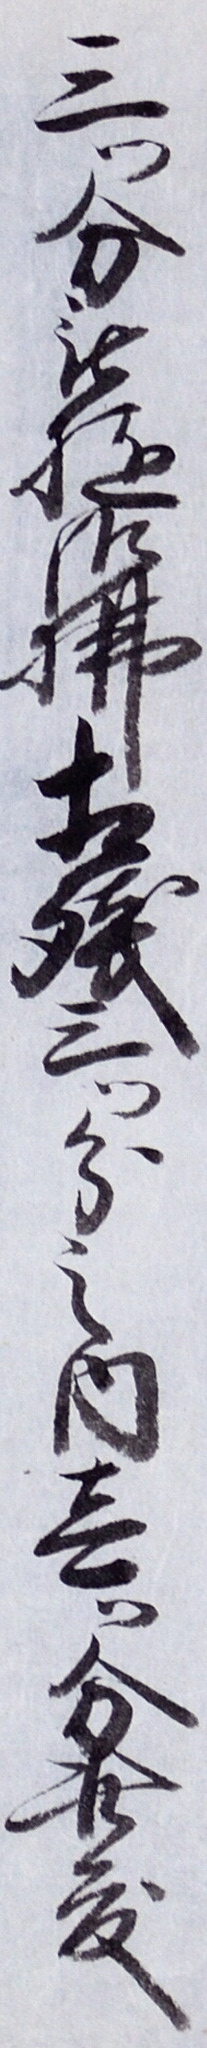三ツ分被遊御払相残三ツ分之内壱ツ分此度
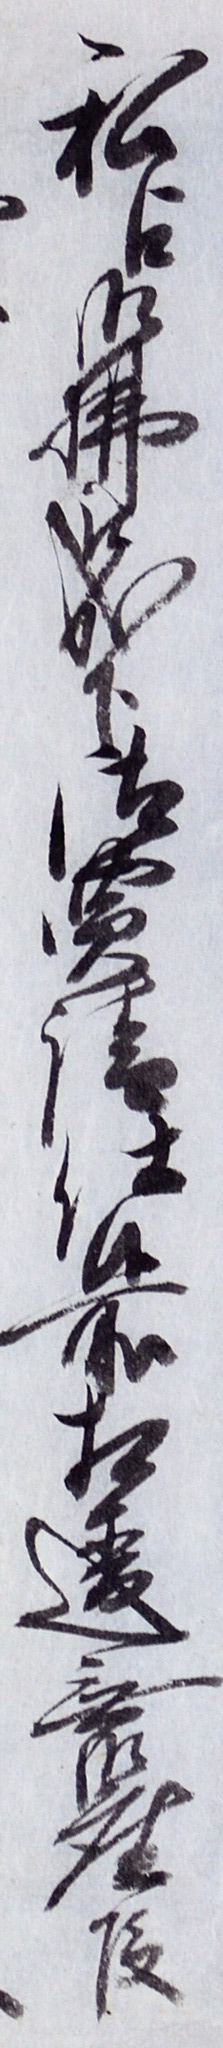私江御払被成下御買請仕候所相違無御座候
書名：御持山御払掟書願書控
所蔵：伊那市立高遠町図書館・合同会社AMANE
